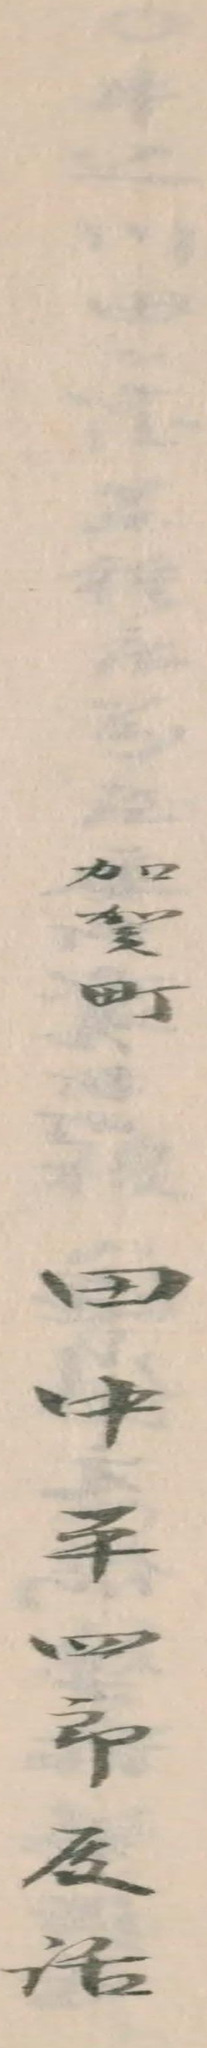加賀町田中平四郎殿話
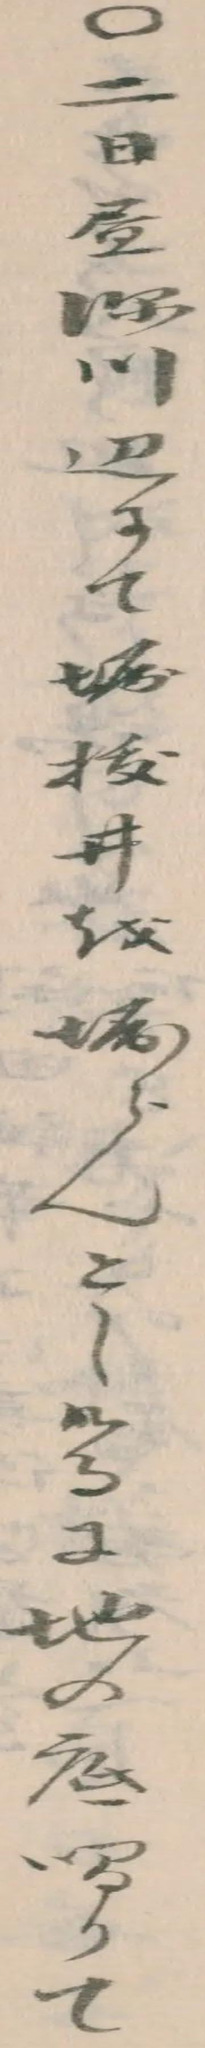〇二日昼深川辺にて堀抜井を掘らんとしけるに地の底鳴りて
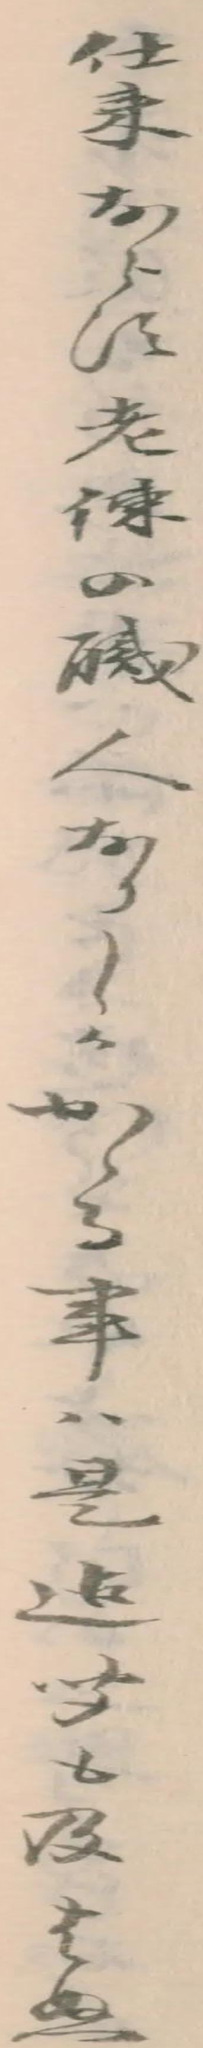仕来ならす老練の職人なりしかかゝる事は是迄聞も及はぬ
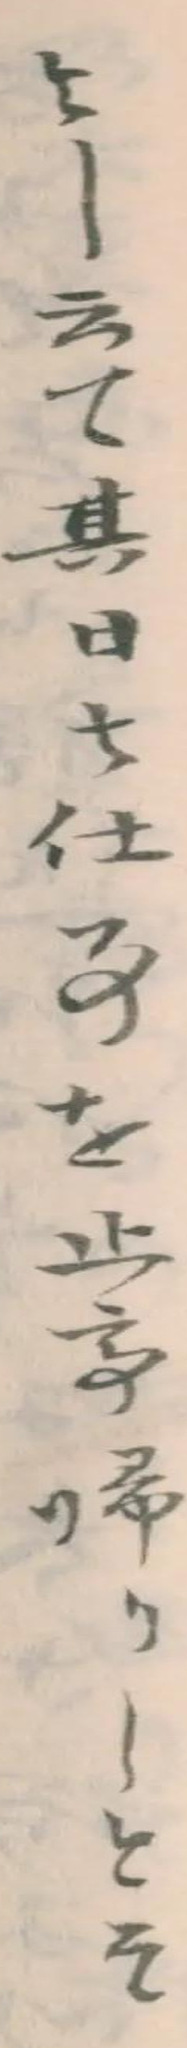よし云て其日は仕事を止て帰りしとそ
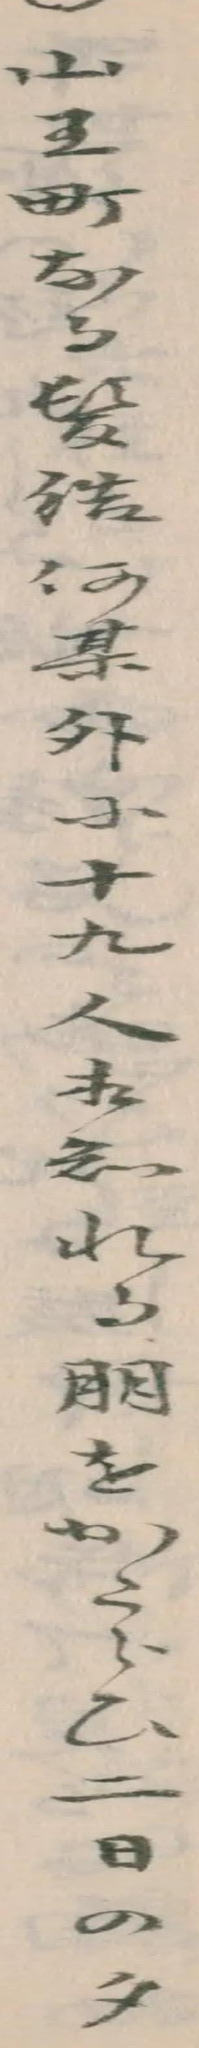〇山王町なる髪結何某外に十九人相知れる朋をかたらひ二日の夕
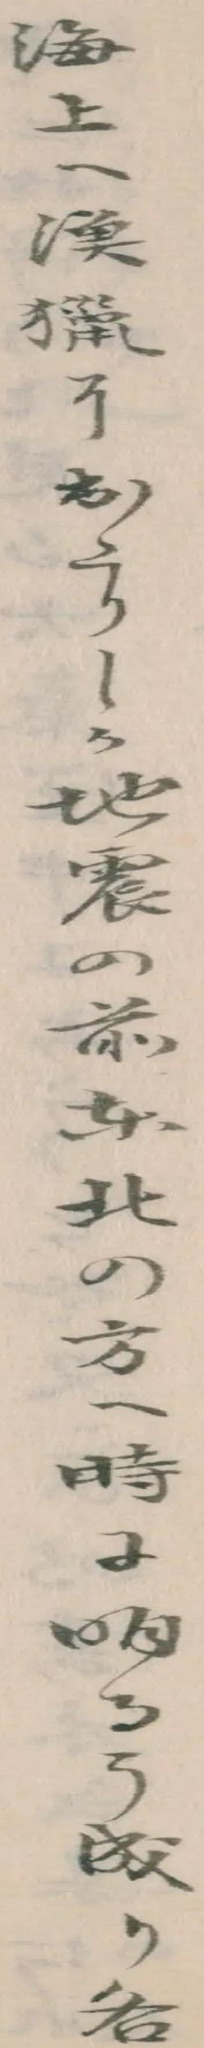海上へ漁猟に出たりしか地震の前東北の方へ時に明るう成り各
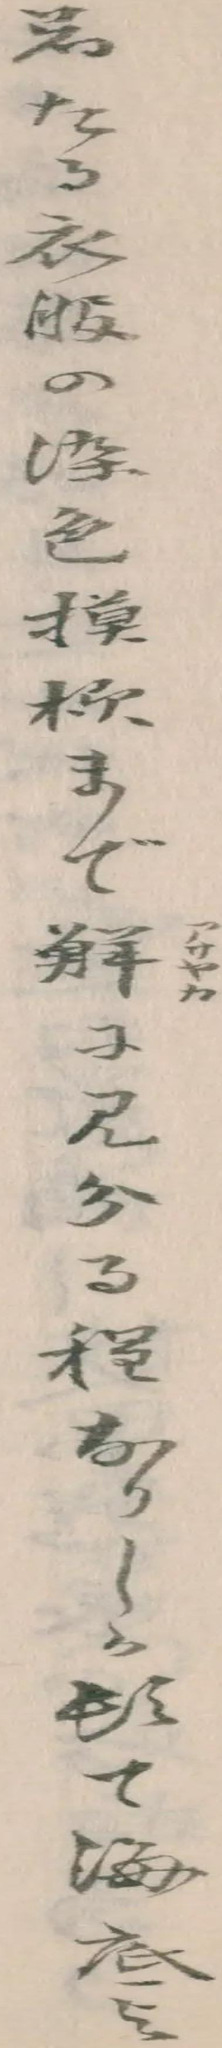着たる衣服の染色模様まで鮮に見分る程なりしか頓て海底よ
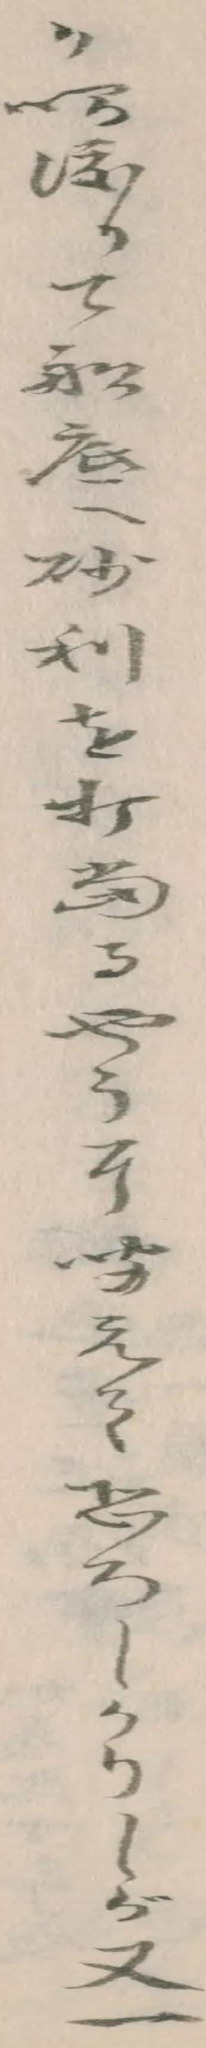り鳴渡りて船底へ砂利を打当るやうに聞えて恐ろしかりしが又一
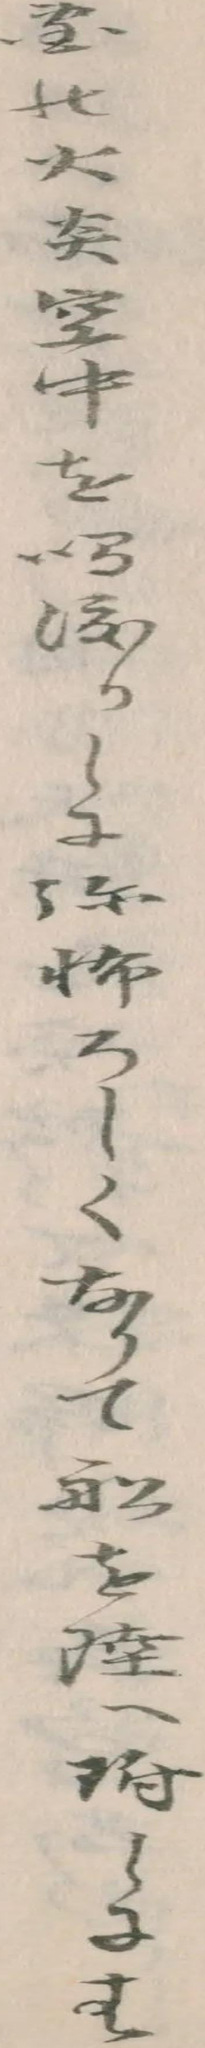団の火炎空中を鳴渡りしに弥怖ろしくなりて船を陸へ附しには
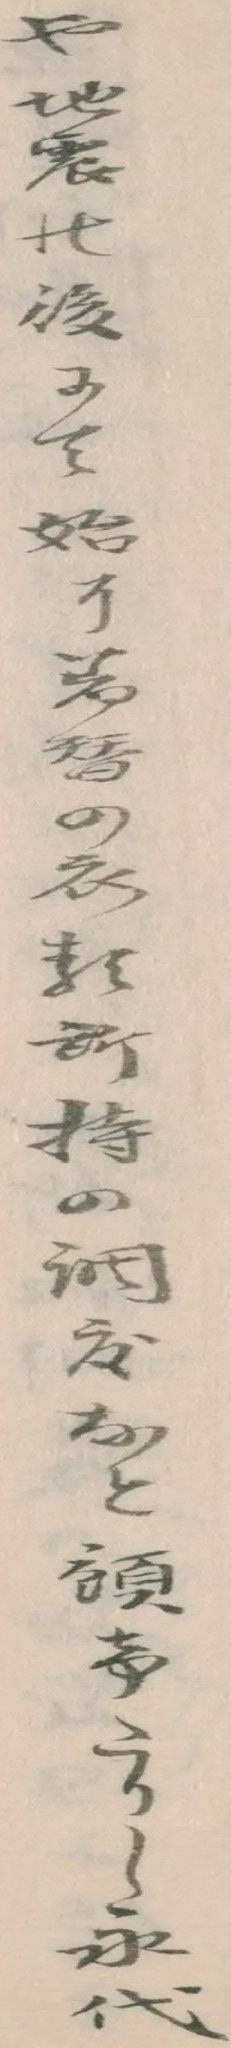や地震の後にて始に着替の衣類所持の調度なと預けたりし永代
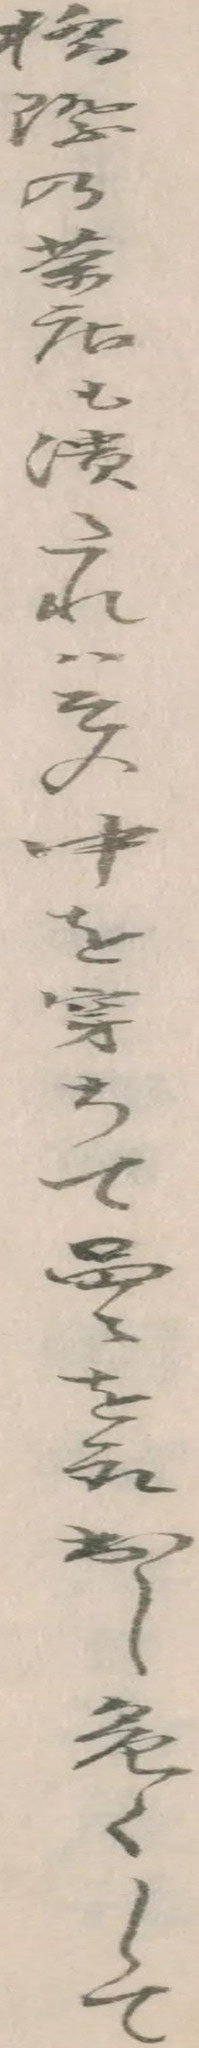橋際の茶店も潰たれはその中を穿ちて品々を取出し危くして
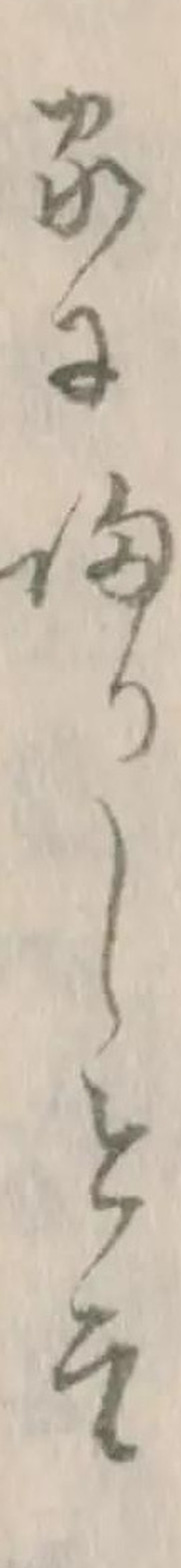家に帰りしとそ

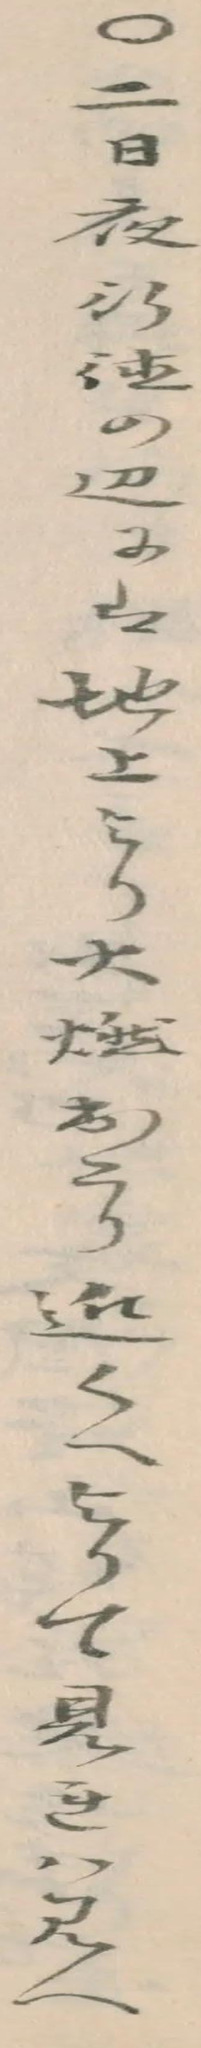〇二日夜行徳の辺には地上より火燃出たり近くへよりて見れは見へ
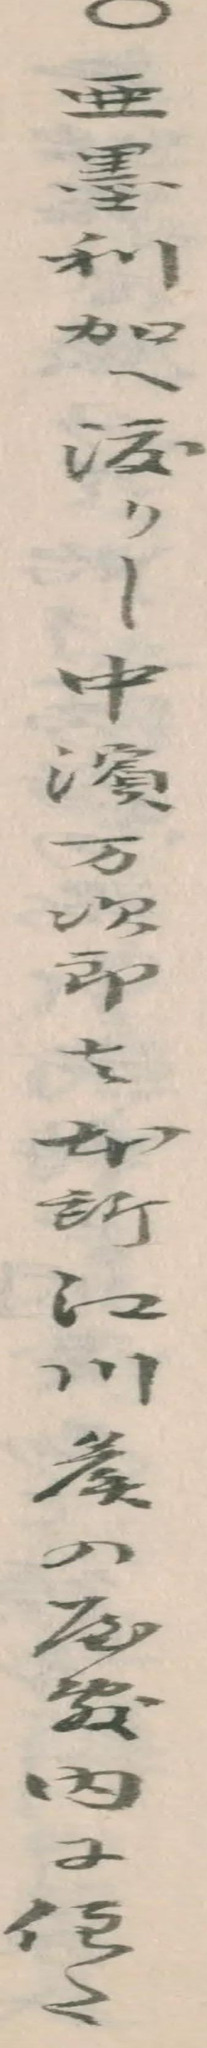〇亜墨利加へ渡りし中濱万次郎は本所江川侯の屋敷内に住た
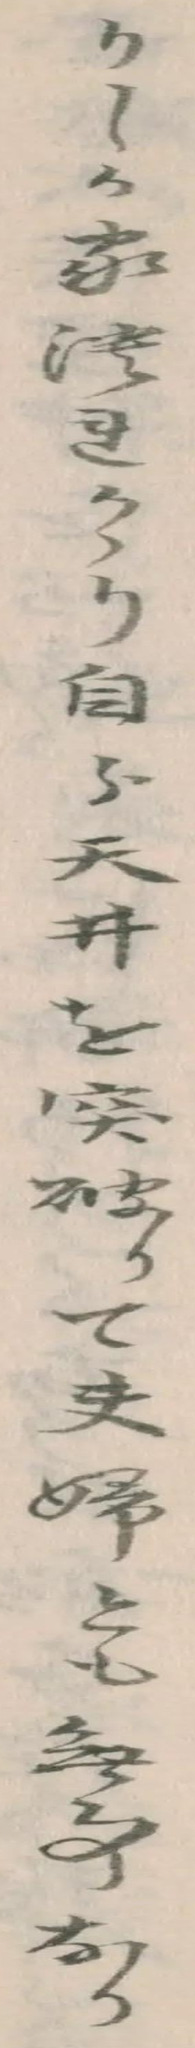りしか家潰れかゝり自ら天井を突破りて夫婦とも無事なり
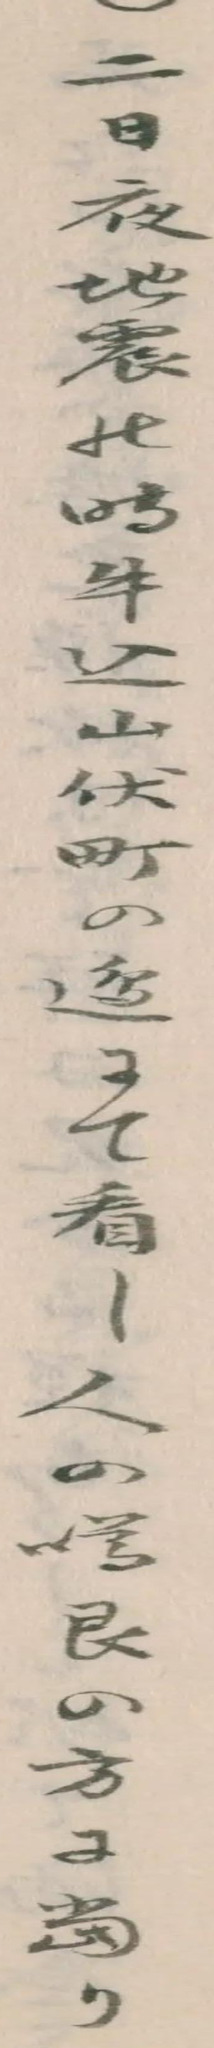〇二日夜地震の時牛込山伏町の辺にて看し人の噂艮の方に当り
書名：地災撮要. 巻7-9(地震之部)
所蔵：国立国会図書館 National Diet Library, JAPAN
